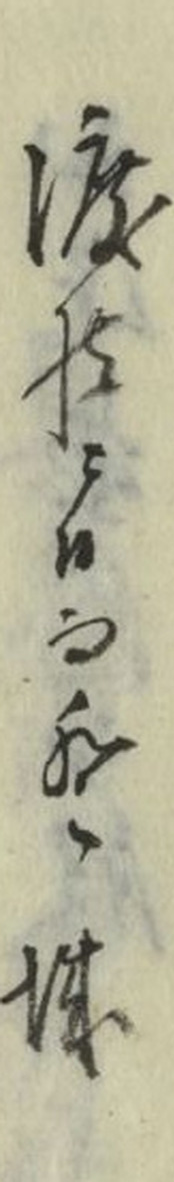渡候に付而登城
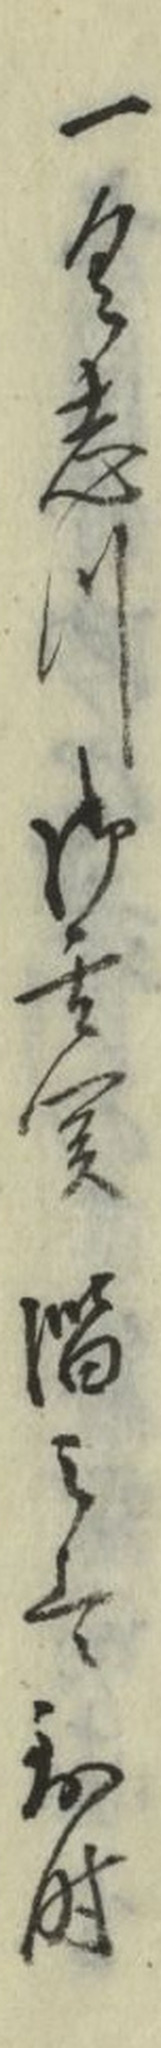一具志川御玄関階之上に到時

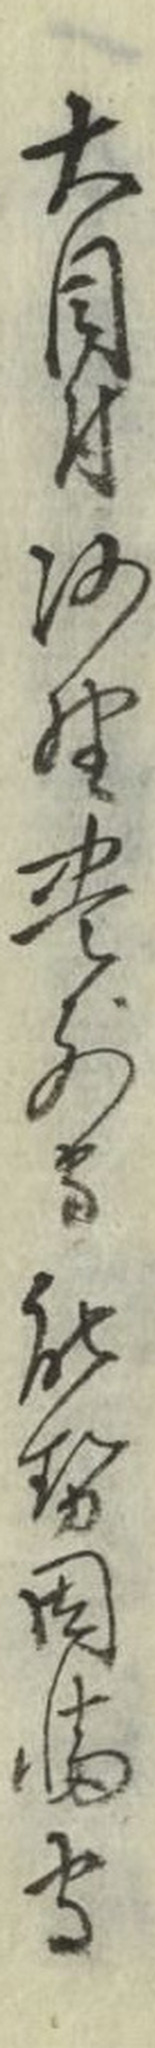大目付河野豊前守能勢因幡守
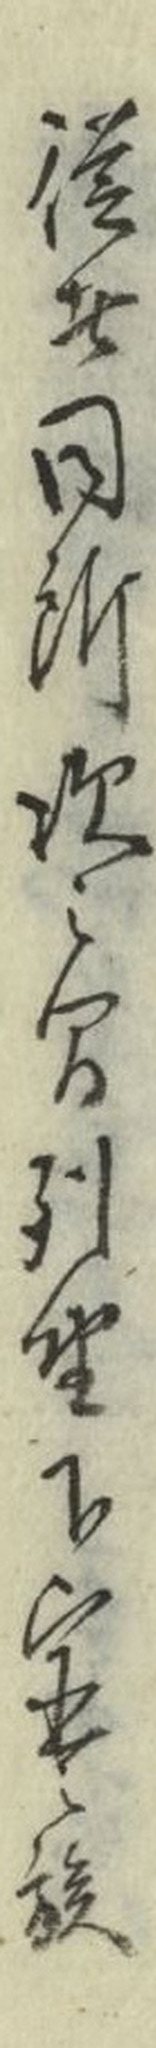従者同所次之間列坐下官之族
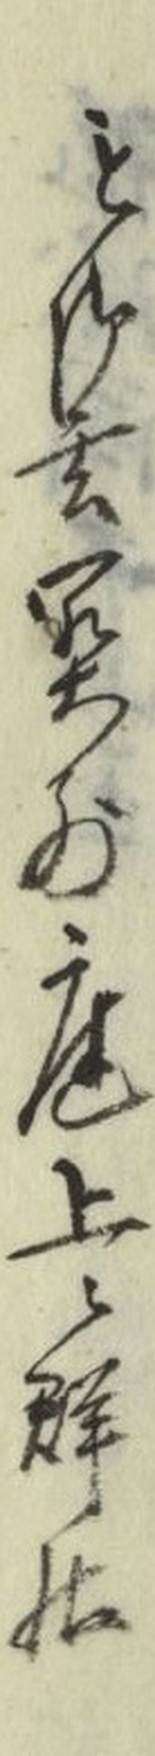は御玄関前庭上に群居
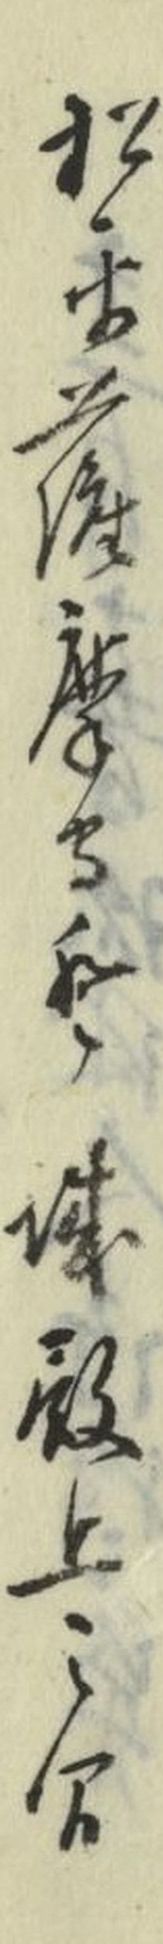松平薩摩守登城殿上之間
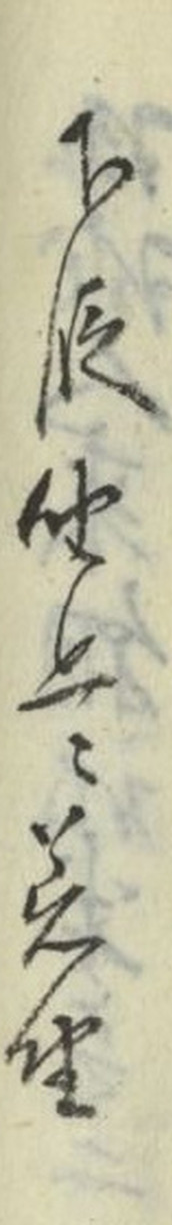下段坐上に着坐
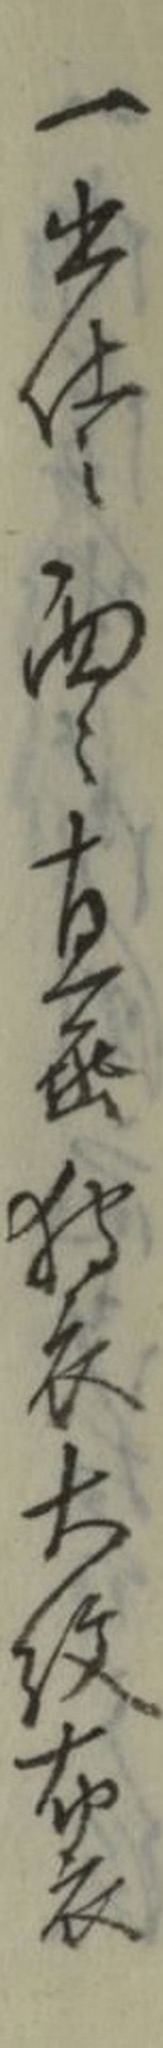一出仕之面々直垂狩衣大紋布衣
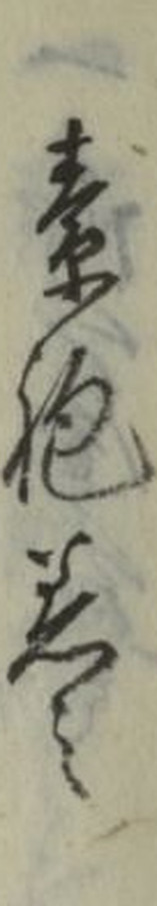素袍着之
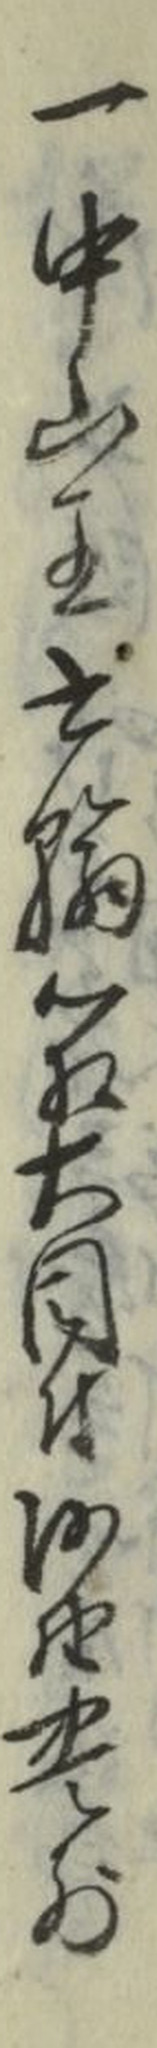一中山王書翰箱大目付河野豊前
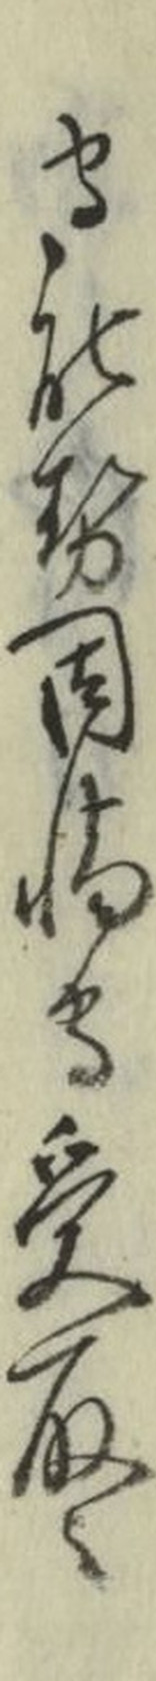守能勢因幡守受取之
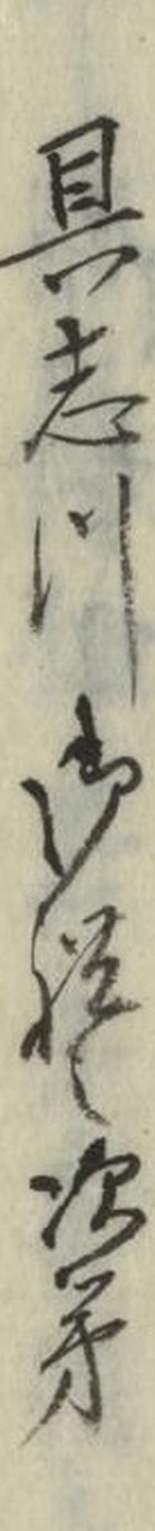具志川御礼之次第

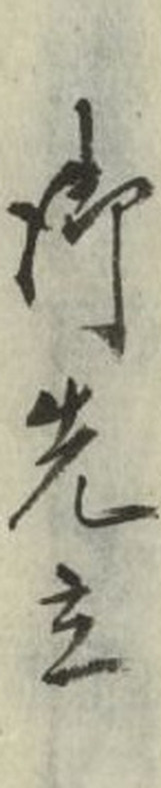御先立
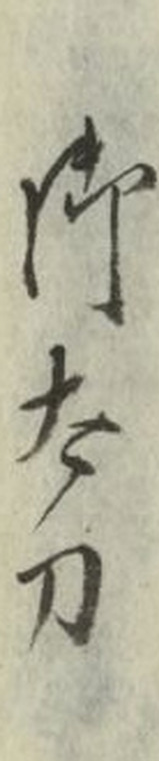御太刀
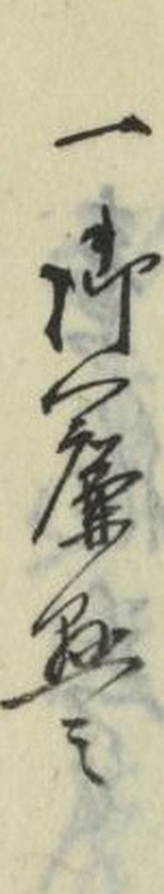一御簾懸之
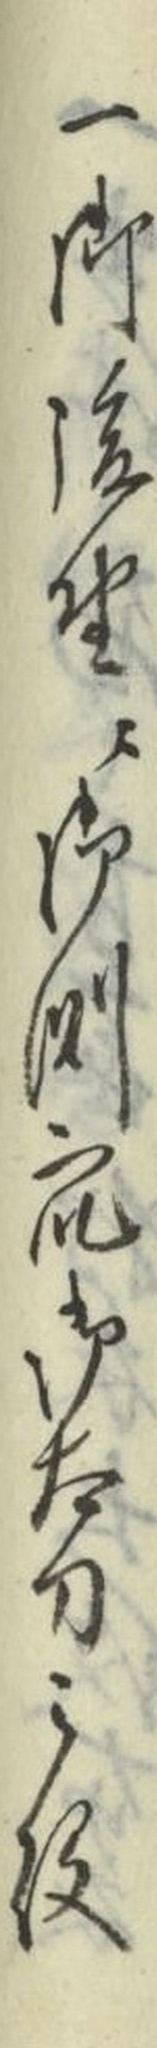一御後坐に御側衆御太刀之役
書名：琉球人来朝記 一之二
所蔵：University of the Ryukyus Library
